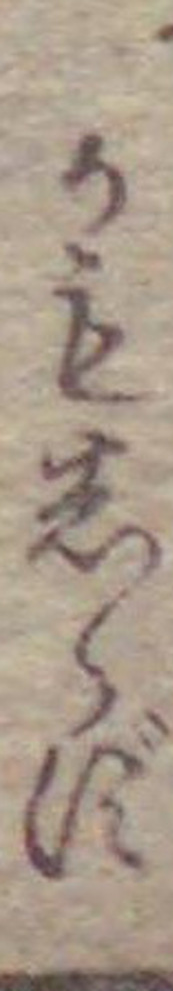かもしらず
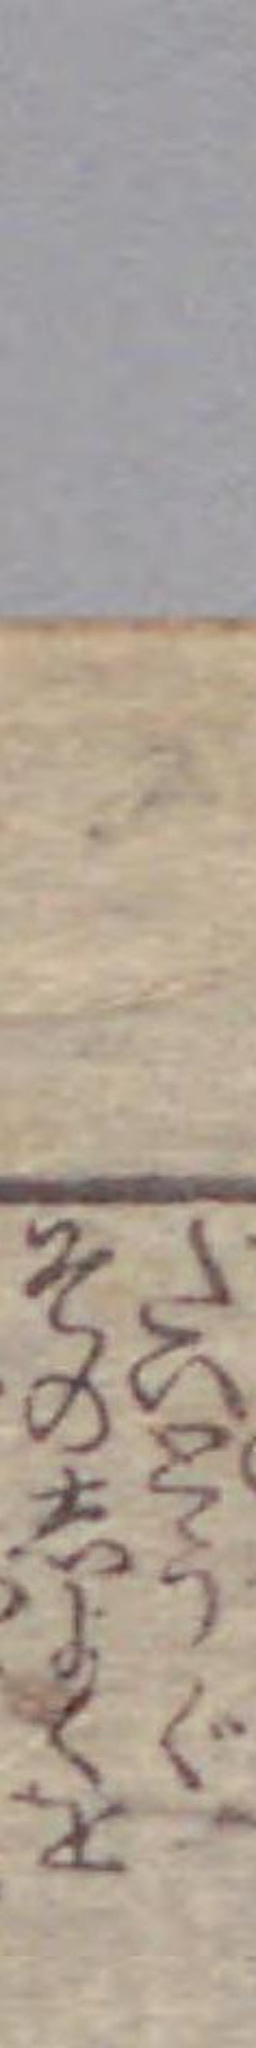そのしよくを
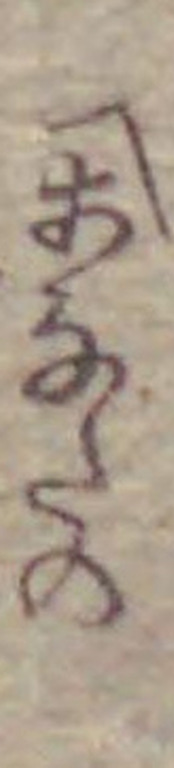〽あなたの
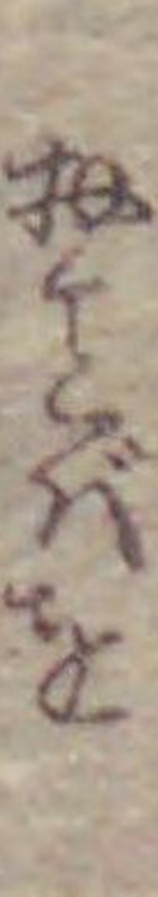おことばを
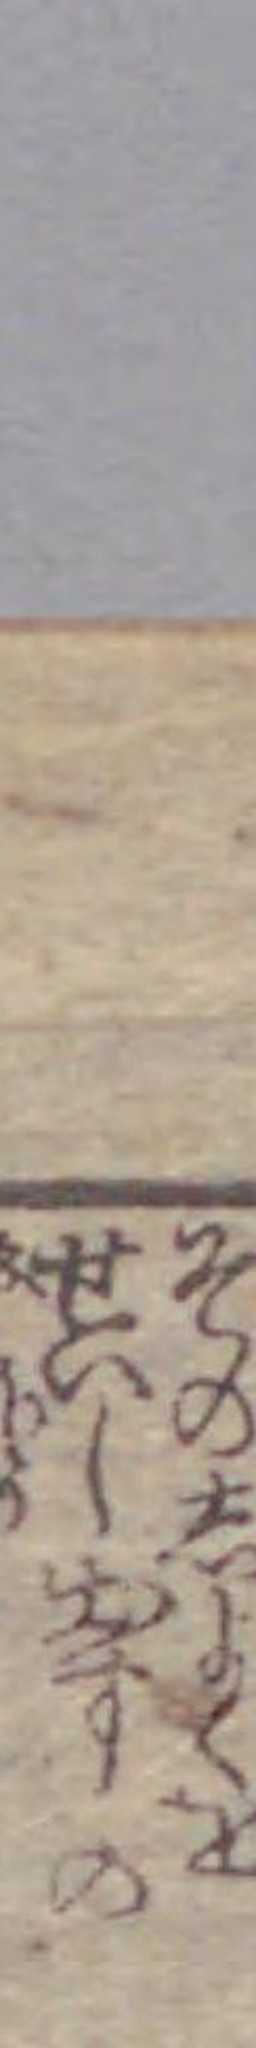せいし出すの
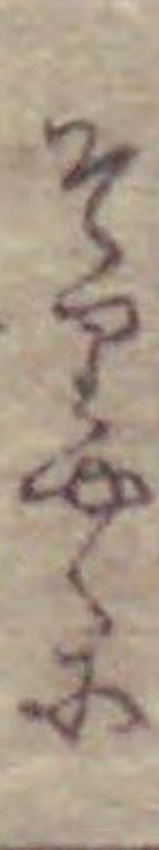そりやくに
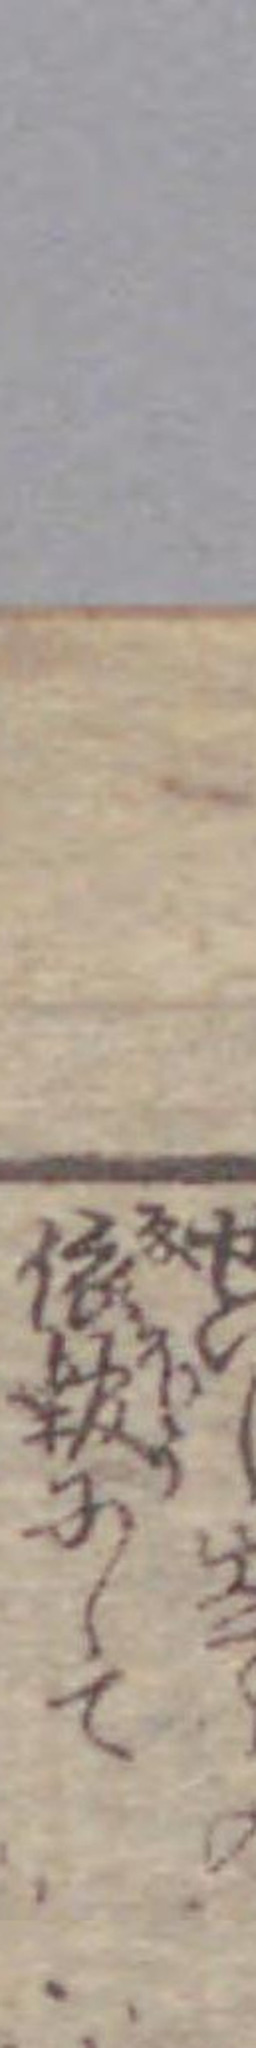依報にして
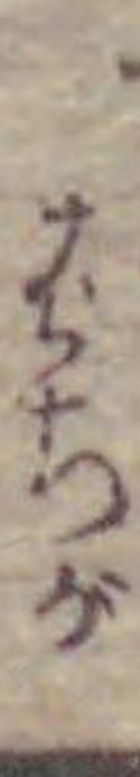ばちが
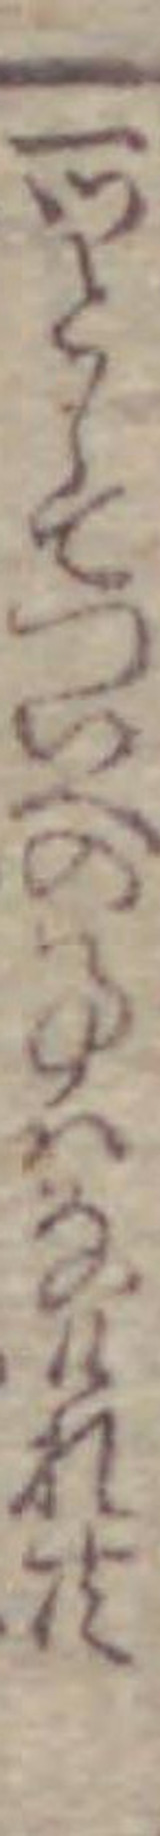一つとしてついへの事はなけれ共
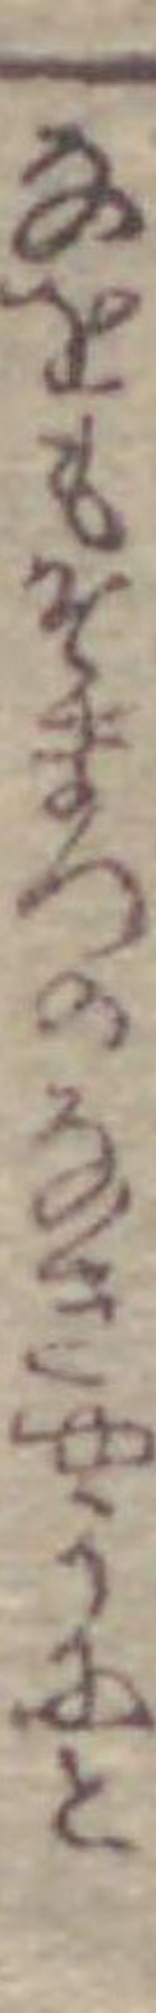なをもそまつのなきやうにと
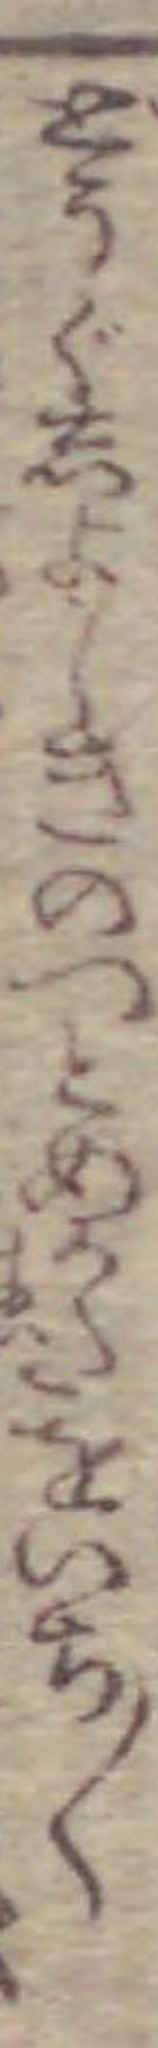どうぐしよしきのつとめかたをいち〳〵
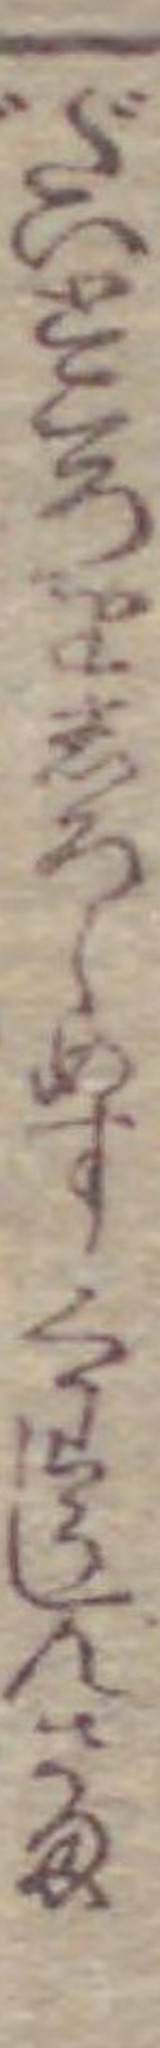だいところをしろしめすくわうしんさま
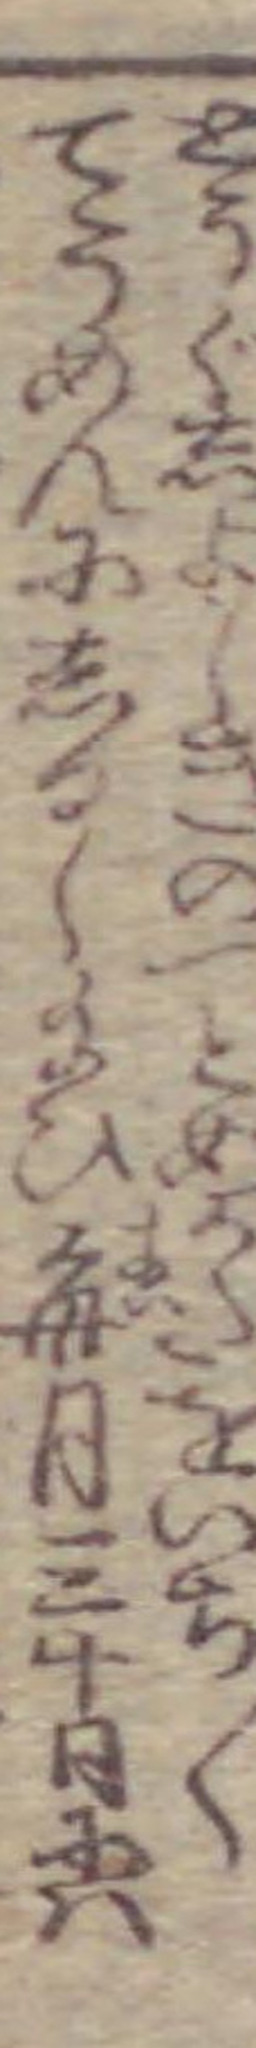てうめんにしるし給ひ毎月三十日には
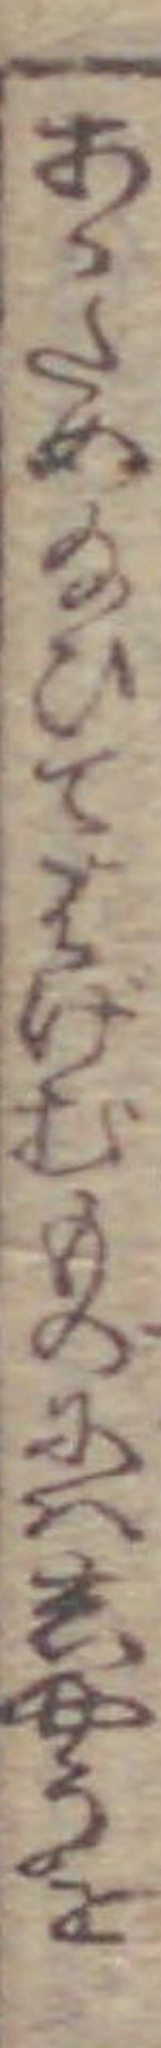あらため給ひてはげむものにはしやうを
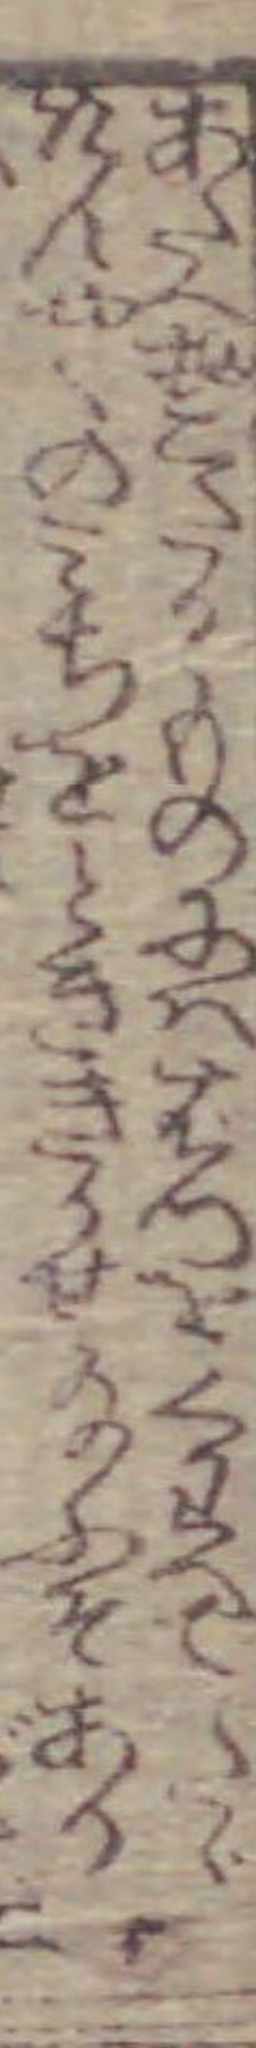けんやくのみちをとききかせ給ふそありがたき
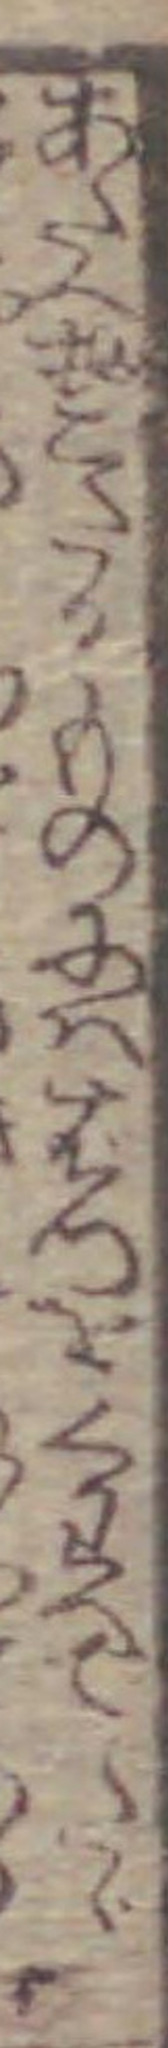あたへおこたるものにはばつをくわへてたゞ
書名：万物小遣帳 : 2巻
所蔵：国立国会図書館 National Diet Library, JAPAN
